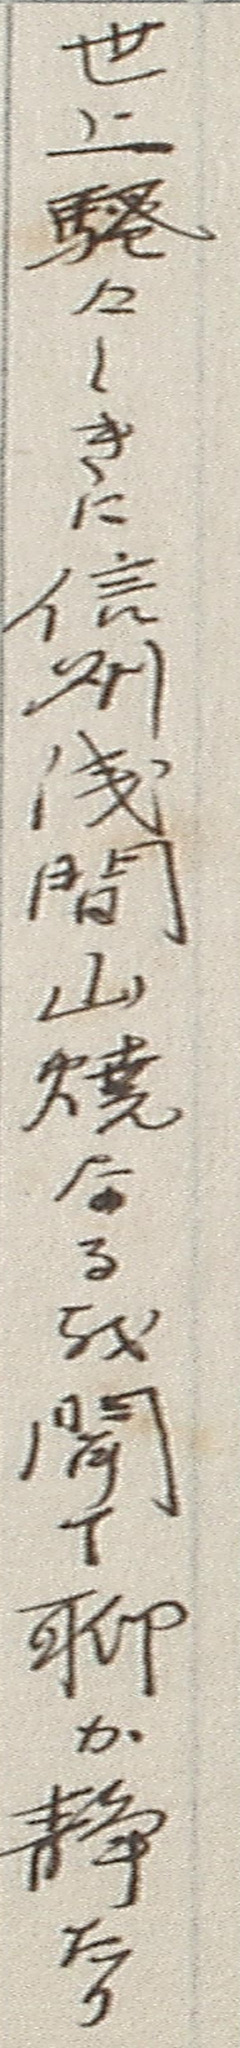世上騒々しきに信州浅間山焼なるを聞て聊か静たり
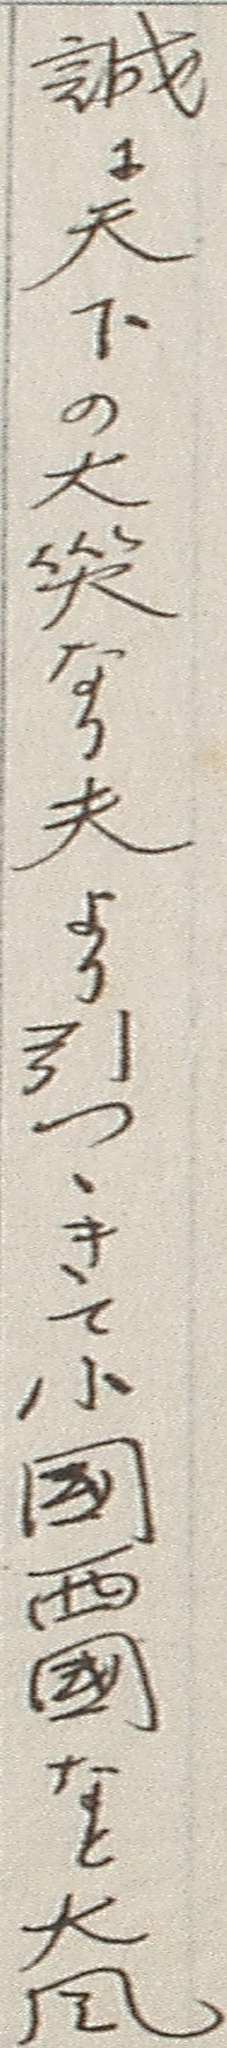誠に天下の大災なり夫より引つゝきて小國西國なと大風
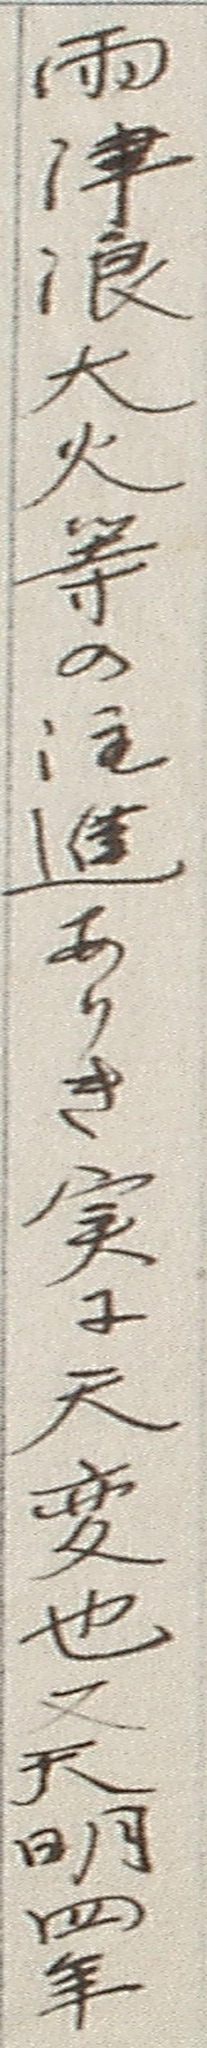雨津浪大火等の注進ありき実に天変也又天明四年
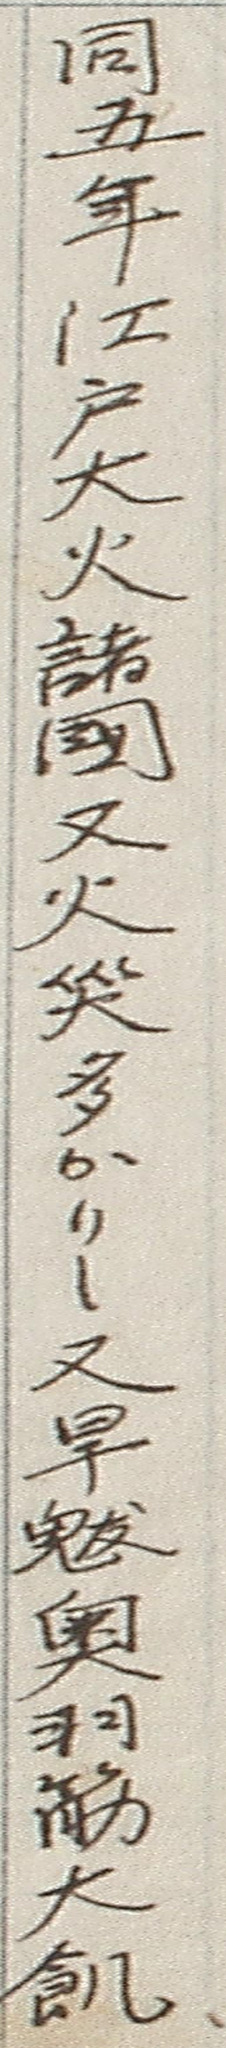同五年江戸大火諸國又火災多かりし又早魃奥羽筋大飢
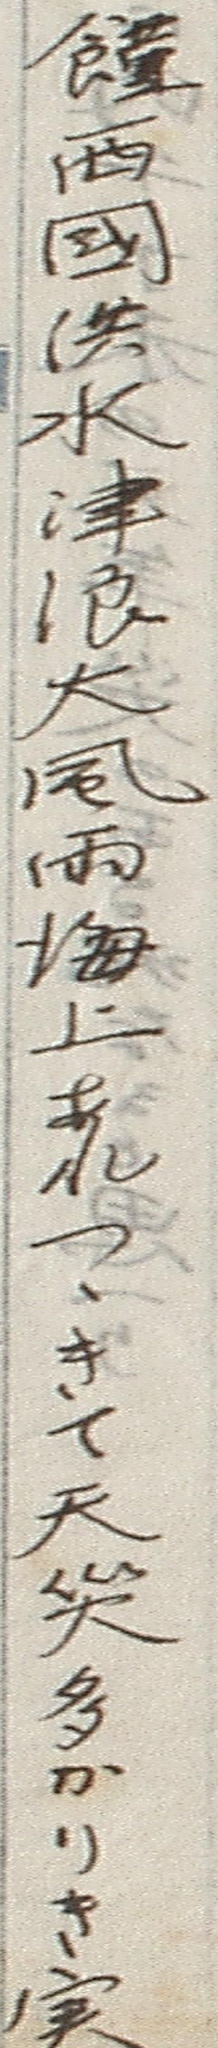饉西國洪水津波大風雨海上あれつゝきて天災多かりき実

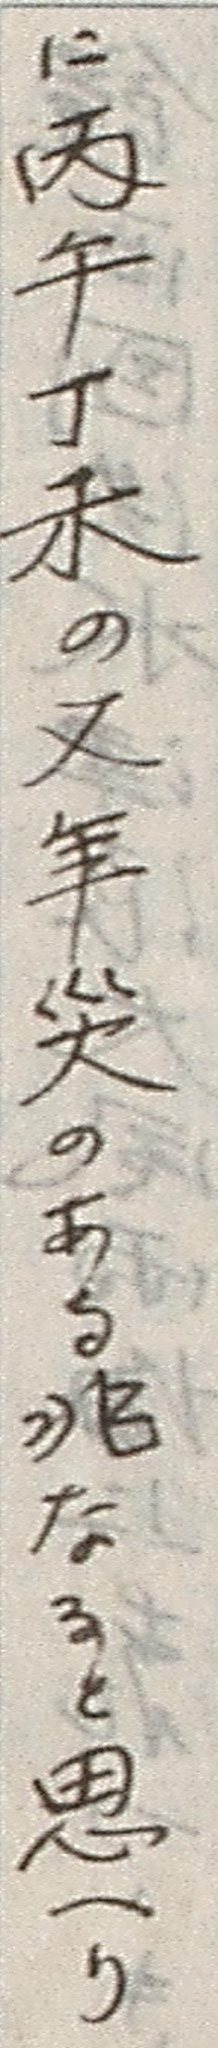に丙午丁未の又年災のある兆なると思へり
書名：浅間山焼出記
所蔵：東京大学地震研究所図書室 Earthquake Research Institute Library, The University of Tokyo, JAPAN
